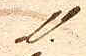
d.o
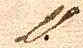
d.o
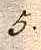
5.
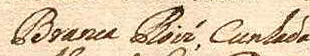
Branca Roiz̄, Cunhada
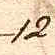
12.
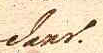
Ianr.o
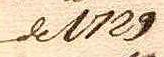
de 1729
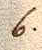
6.
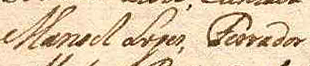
Manoel Lopes, Ferrador
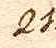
21.
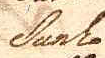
Iunho
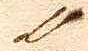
d.o
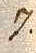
7.
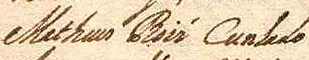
Matheus Roiz̄ Cunhado
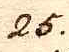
25.
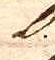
d.o
